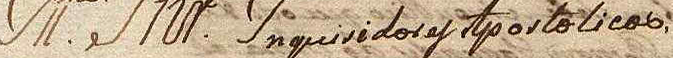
Illmos e Snr.es Inquizidores Apostolicos,
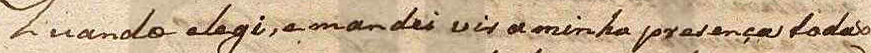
Quando elegi, e mandei vir a minha presença todas
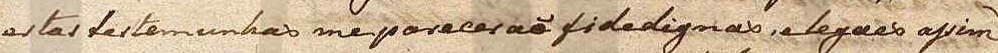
estas testemunhas me pareceraõ fidedignas, e legaes assim
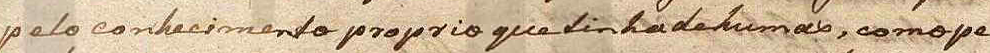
pelo conhecimento proprio que tinha de humas, como pe
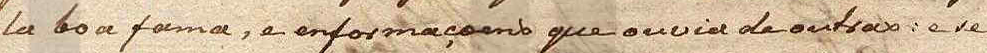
la boa fama, e enformaçoens que ouvia de outras: e se
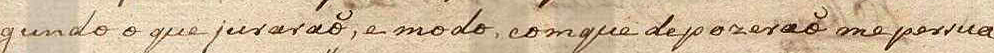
gundo o que juraraõ, e modo, com que depozeraõ me persua
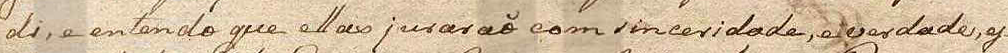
di, e entendo que ellas juraraõ com sinceridade, e verdade, es
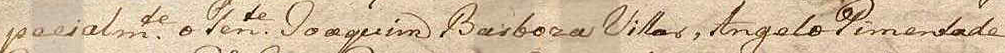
pecialm.te o Ten.te Ioaquim Barboza Villar, Angelo Pimenta de
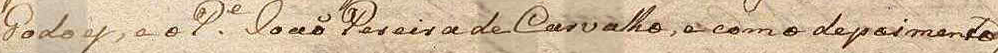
Godoes, e o P.e Ioaõ Pereira de Carvalho, e com o depoimento
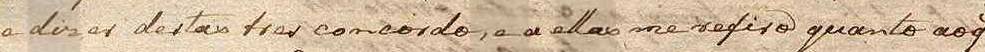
a dizer destas tres concordo, e a ellas me refiro quanto ao q̄
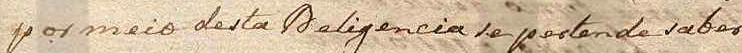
por meio desta Deligencia se pertende saber.
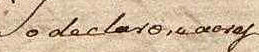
So declaro e acres
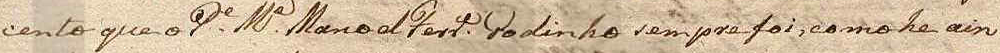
cento que o P.e M.e Manoel Ferr.a Godinho sempre foi, como he ain
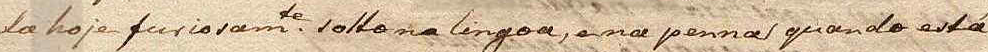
da hoje furiosam.te solto na lingoa, e na penna quando está
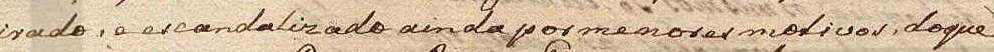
irado, e escandalizado ainda por menores motivos, do que
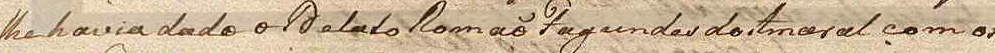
lhe havia dado o Delato Romaõ Fagundes do Amaral com os
